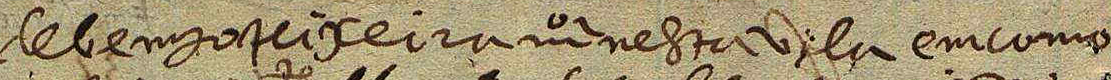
de bemto teixeira mor nesta vila em como
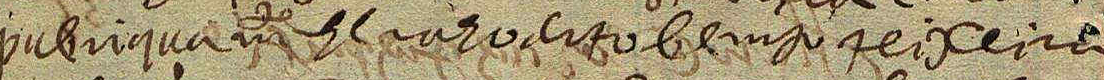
pubriquamte hera ho dito bemto teixeira
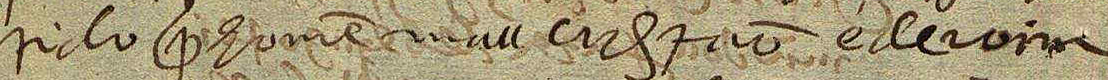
tido p̄ homē mau cristaõ e de roim
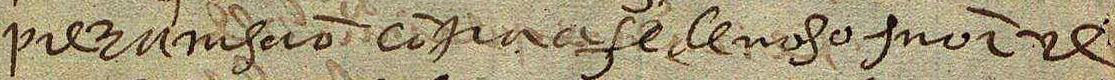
prezumsaõ cōtra a fe de noso snor̄ ye
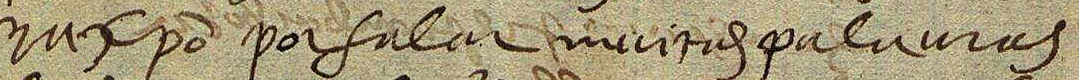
zu xpō por falar muitas palauras
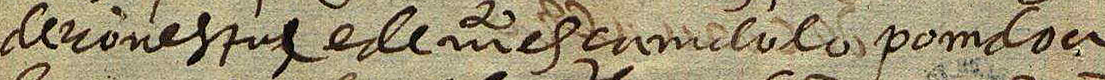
dezonestas e de mto escamdolo pomdo a
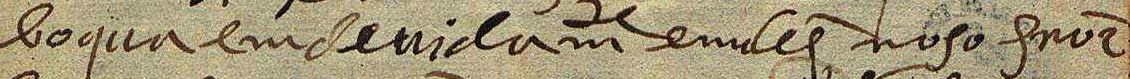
boqua emdeuidamet em des̄ noso snōr
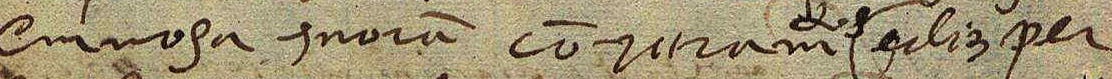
em nosa snorā cō yuramtos q̄ diz per
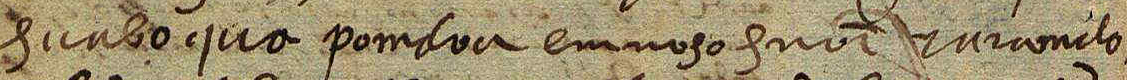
sua boqua pomdoa em noso snōr yuramdo
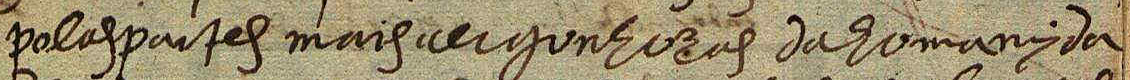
polas partes mais uergonhozas da homanyda
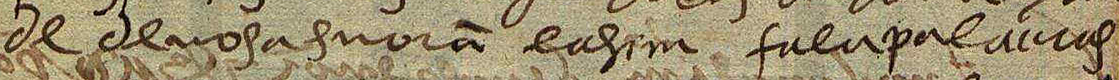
de de nosa snorā e asim fala palauras
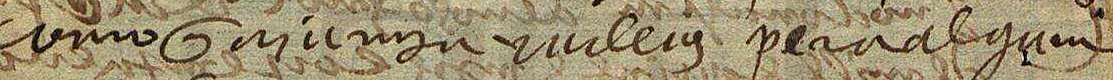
como q̄ ajumta yudeus pera algum
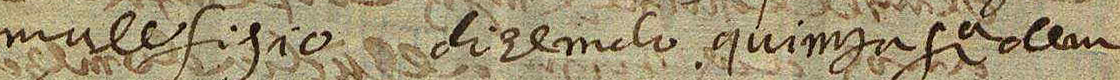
malefisio dizemdo quimta fra dem
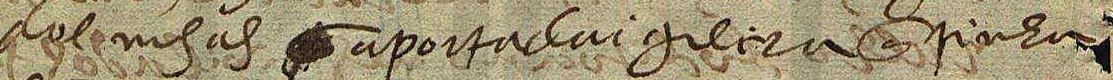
doemsas q̄ a porta da igreiya q̄ tinha
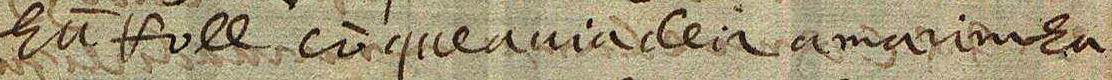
hū Roll cō que auia de ir a marimha
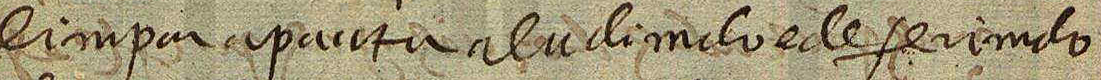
limpar a pauta aludimdo e deferimdo
